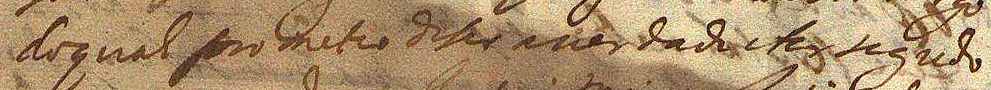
do qual prometeo diser a uerdade e ter segredo
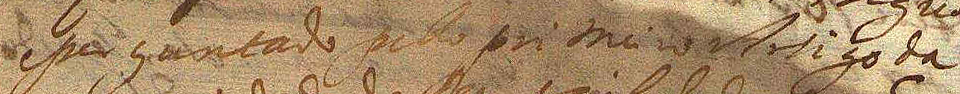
e perguntado pello primeiro Artigo da
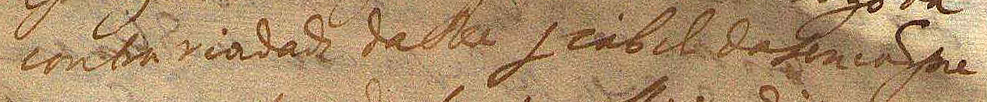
contrariadade da Ree Jzabel dasençaõ pre
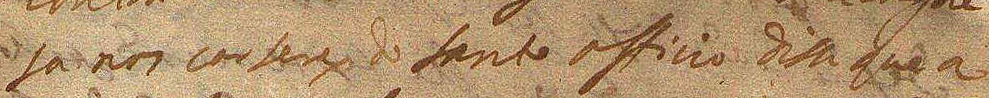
sa nos carseres do santo officio disse que a
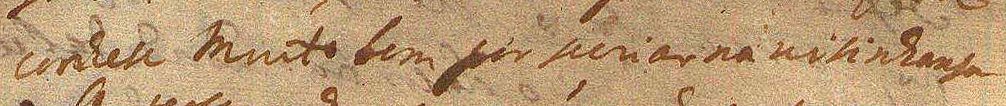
conhese muito bem por se criar na uizinhansa
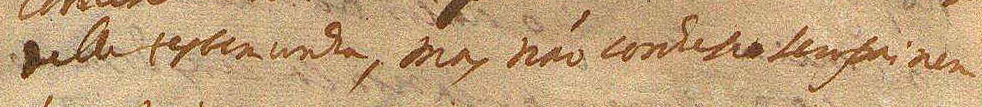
delle testemunha, mas naõ conheseo seu pai nem
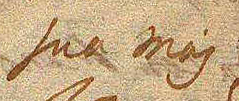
sua maj
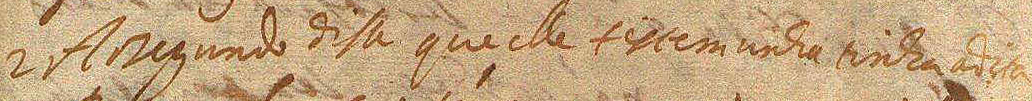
2 Ao segundo disse que elle testemunha tinha a dita
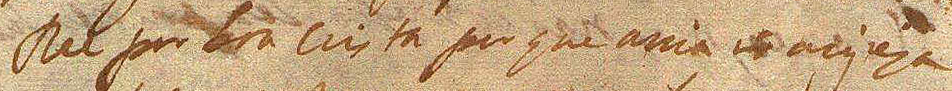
Ree por boa cristã perque auia ir a igreja
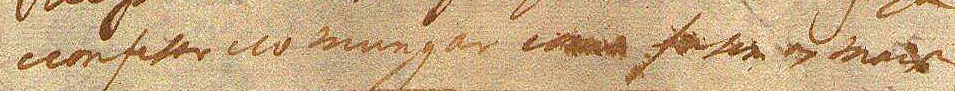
e confesar e comungar como fasem os mais
